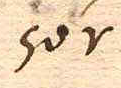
sor̄
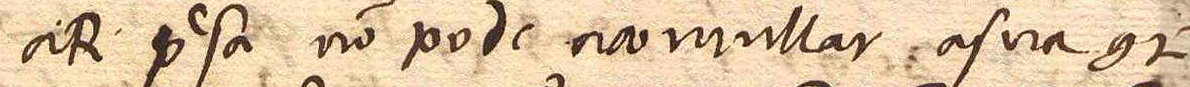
a .R. p̄sa nō pode acomullar a sua ꝯt̄
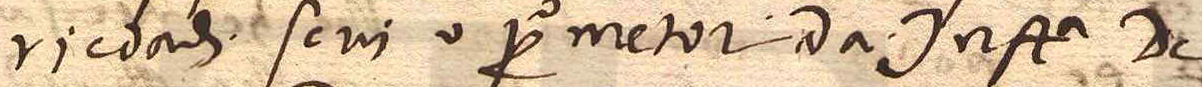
rjedade sem o ꝓometor da Justa de
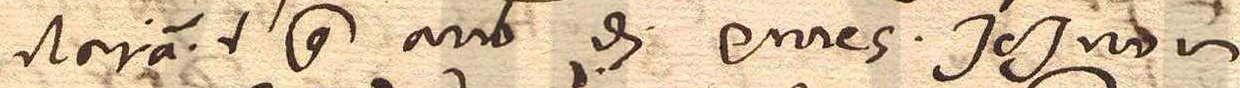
clarā. ē q̄ ano dj e mes. JeJuou
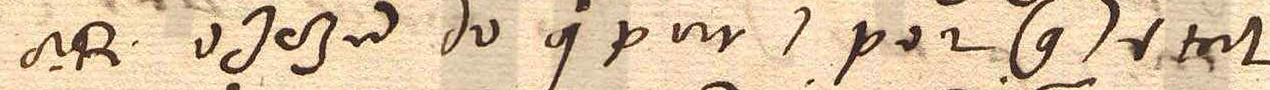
a .R. o JeJū do qipur / porq̄ ē tal
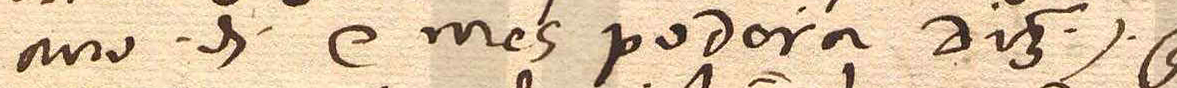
ano .dj e mes podera diz̄ /. q̄
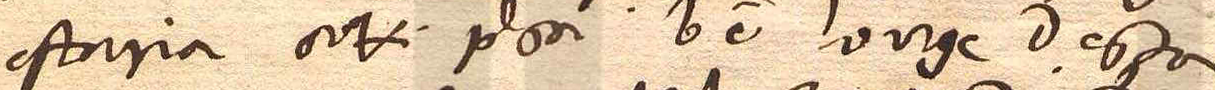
estaria a R. p̄sa bē longe desta
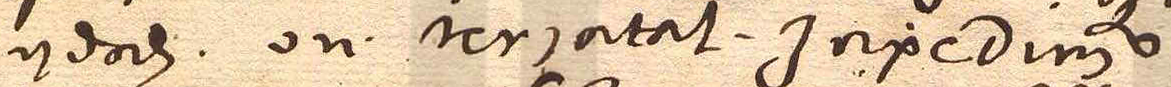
çjdadj ou terja tal. Jnpedimto
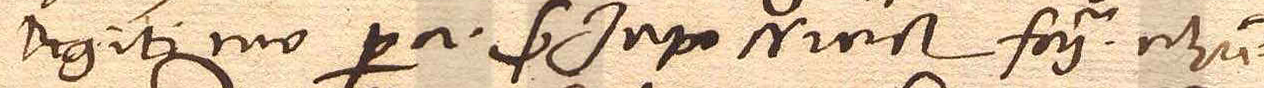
ligitimo ꝑa. ꞩ Jnpossiuel faz̄. nhū
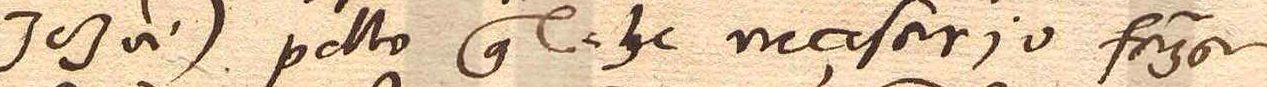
JeJū. pello q̄l. he neçesarjo faz̄se
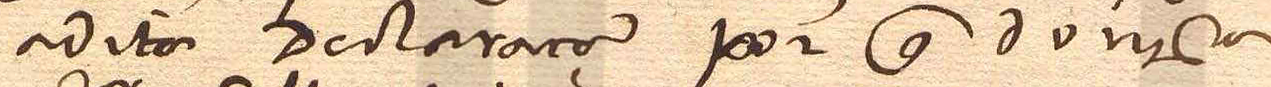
a dita declaraçā por q̄ doutra
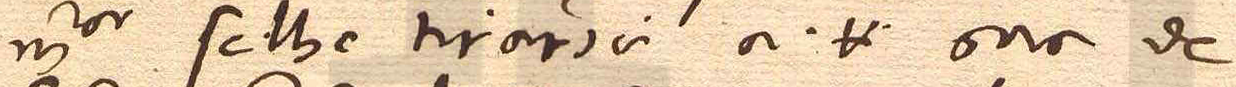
mra se lhe tiraria a .R. sua de
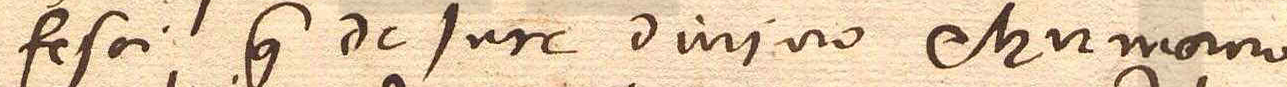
fesa. q̄ de Jure diuino e humano
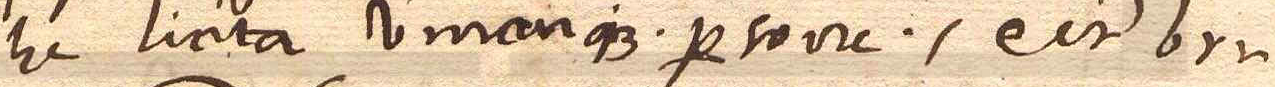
he licita vmarqz. ꝑ soac ./ e et̄ bru
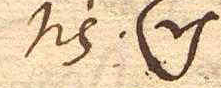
tis. c̄ꝭ
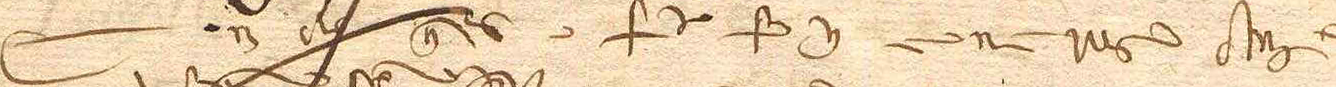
Com As q̄es o fto foy concruso Anto
